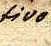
tivo
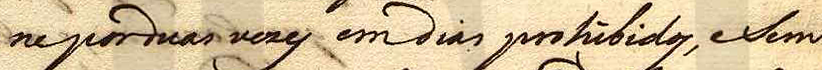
ne por duas vezes em dias prohibidos, e Sem
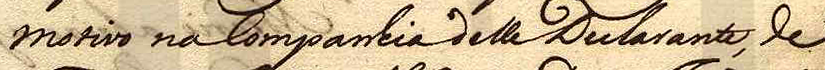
motivo na Companhia delle Declarante, de
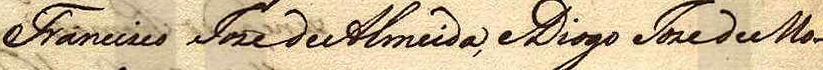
Francisco Ioze de Almeida, e Diogo Ioze de Mo
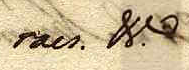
raes. &r.
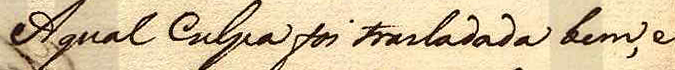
A qual Culpa foi trasladada bem, e
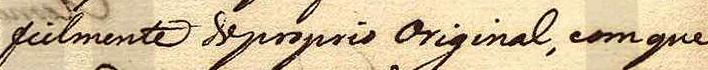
fielmente do proprio original, com que
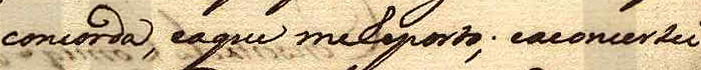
concorda, e a que me Reporto; e a concertei
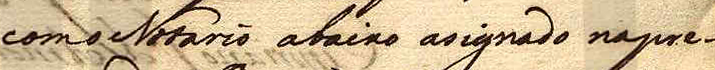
com o Notario abaixo asignado na pre
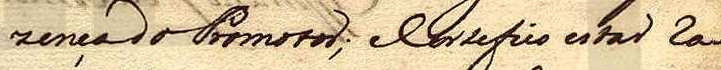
zença do Promotor; e Certifico estar Ra
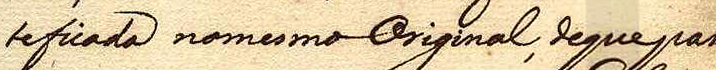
teficada no mesmo Original, de que pas
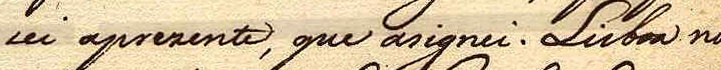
sei a prezente, que asignei. Lisboa no
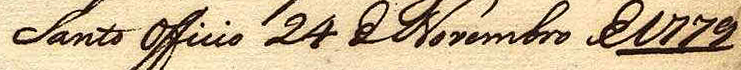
Santo Officio 24 d̄ Novembro d̄ 1779
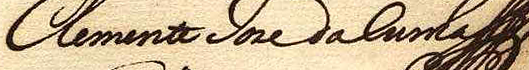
Clemente Ioze da Cunha
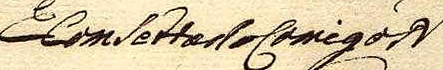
E Comsertado Comigo No
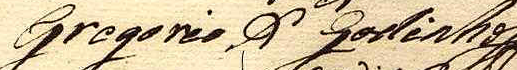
Gregorio A Godinho
